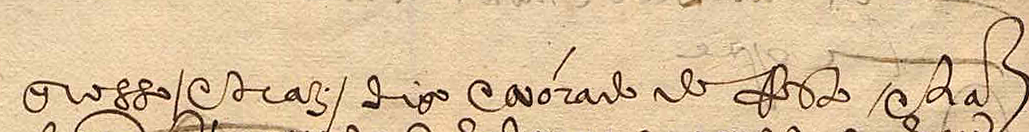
grosso / e traz / digo e coorado do Rosto / e traz
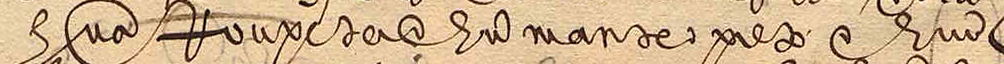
hūa Roupeta e hū manteo preto e huū
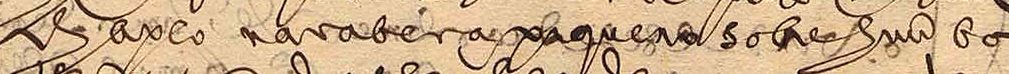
chapeo na cabeça piqueno sobre huū ba
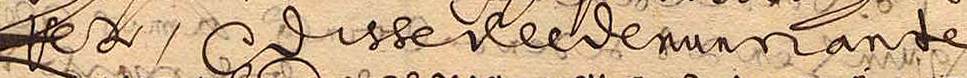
Rete / e disse elle denunciante
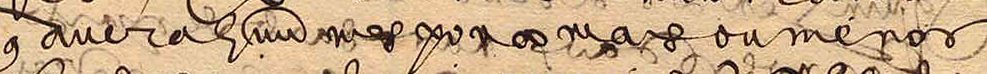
q̄ auera huū mes pouco mais ou menos
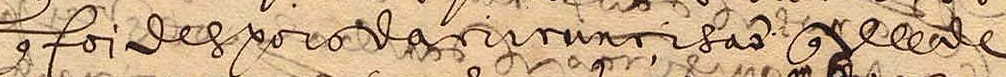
q̄ foj despois da circuncisaõ q̄ elle de
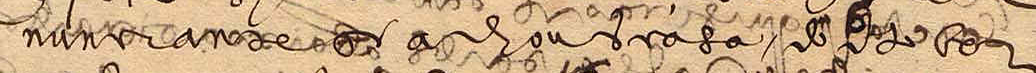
nunciante se achou ē casa / do dito ber
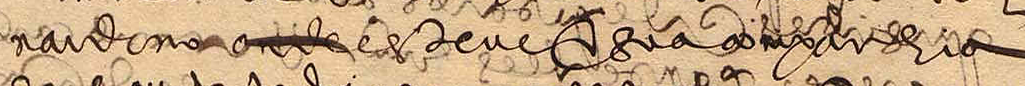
nardino onde esteue ē sua companhia
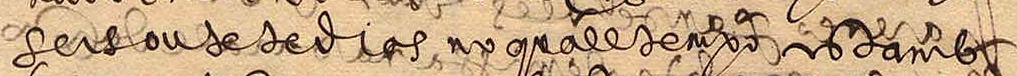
seis ou sete dias no quall tempo estando
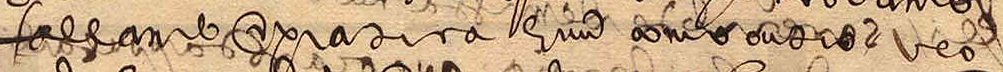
fallando ē pratica huū com o outro veo
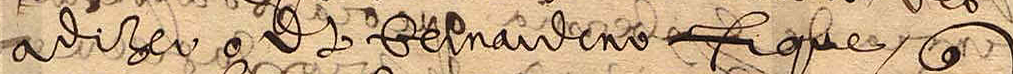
a dizer o dito bernardino fique / q̄
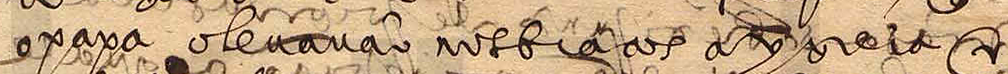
o papa o leuauaõ nos braços a Ygreia ē
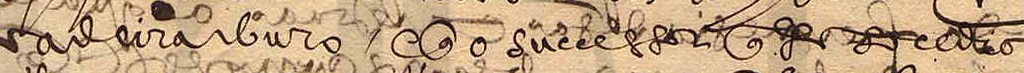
cadeira douro / e q̄ o successor q̄ lhe socedeo
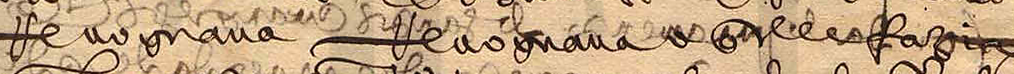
Reuoguaua Reuoguaua o q̄ elle fazia
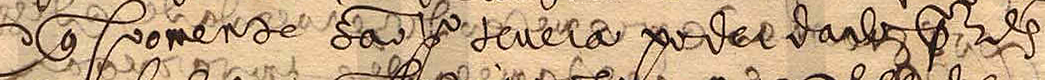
e q̄ soomente são po teuera poder dado por ds̄
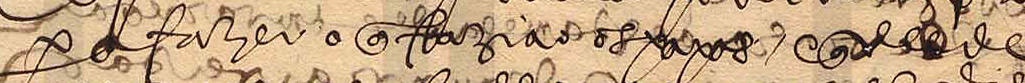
ꝑa fazer o q̄ faziao os papas / e q̄ elle de
